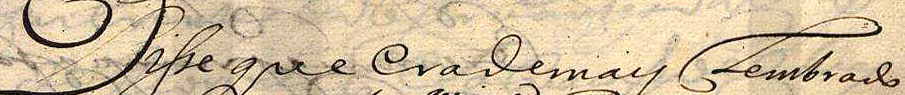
Disse que era de mais Lembrado
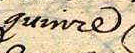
quinze
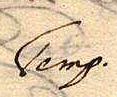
Temp.
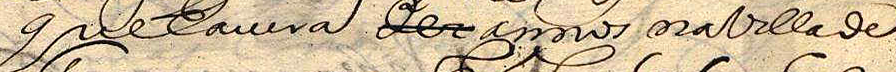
que hauera dez annos na villa de
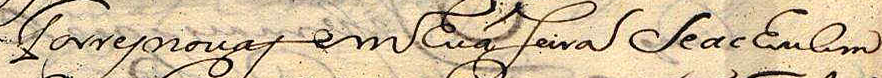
Torres nouas em huā feira Se achou Com
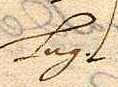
Lug. L.
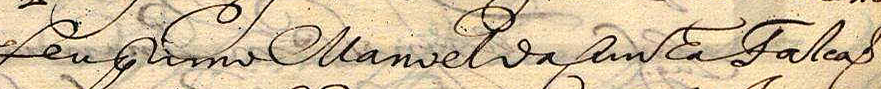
seu primo Manoel da Cunha Falcaõ
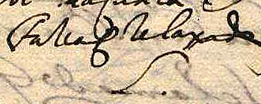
Falcaõ Relaxado
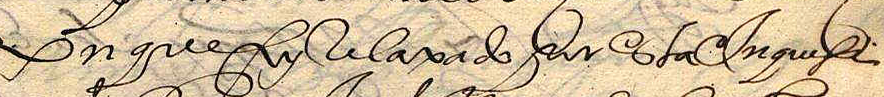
xn que foy Relaxado por esta Inquesi
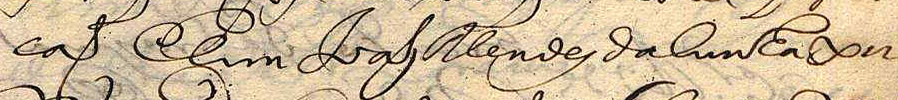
çaõ E com Ioaõ Mendes da Cunha xn
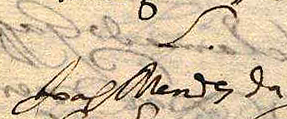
Joaõ Mendes da
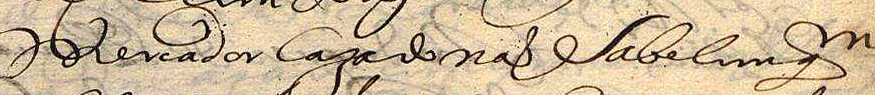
mercador Cazado naõ Sabe com qm
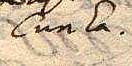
Cunha.
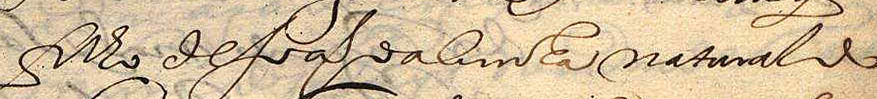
filho de Joaõ da Cunha natural do
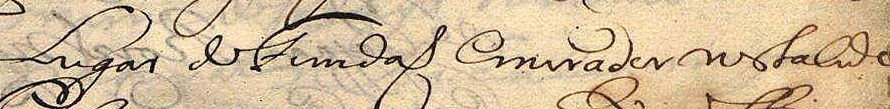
Lugar do Fundaõ E morador nesta Cide
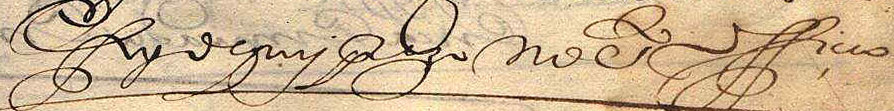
E foy depois pRezo no Sto officio
